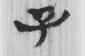子
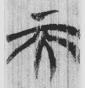天
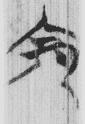命
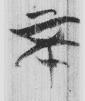不
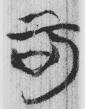可
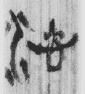漗
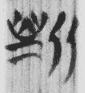斯
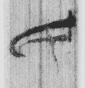民
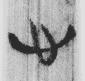心
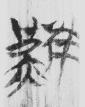難
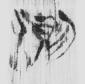測
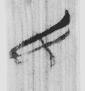民
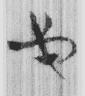弋
